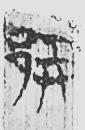{邑工廾}
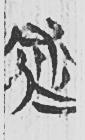述
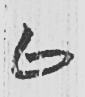㠯（以）
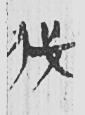伐
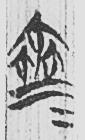齊=
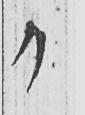人
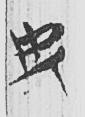𡚦
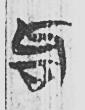{㠯ㅋ}
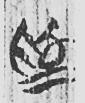爲
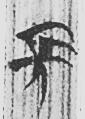長
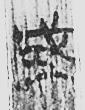城
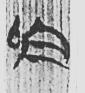於
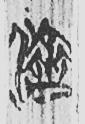濟
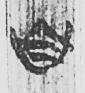自
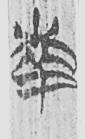南
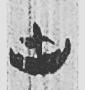山
